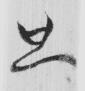也
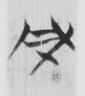凡
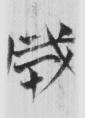成
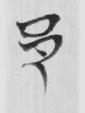邑
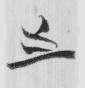之
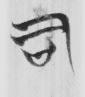司
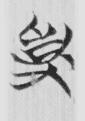事
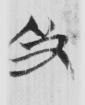及
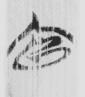官
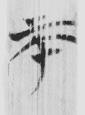帀
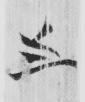之
